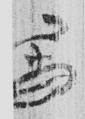昏
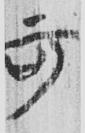可（何）
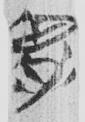{胃刀}（謂）
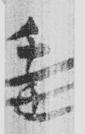○（仁）
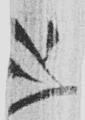之
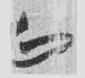㠯（以）
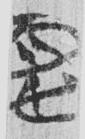惪（德）
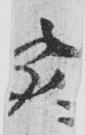孔子
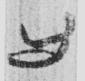君
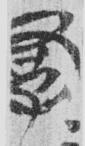君子
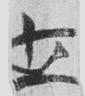才（在）
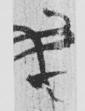民
